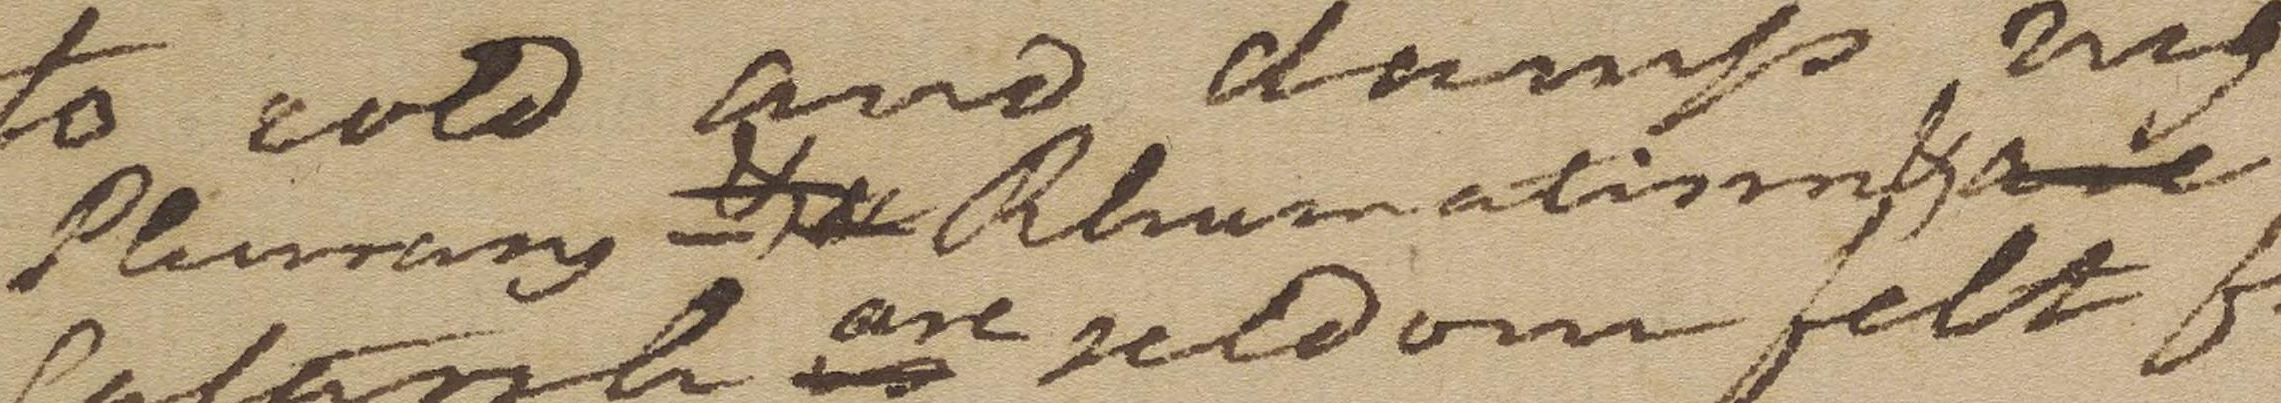pleurasy & [__] Rhumatism & [are]
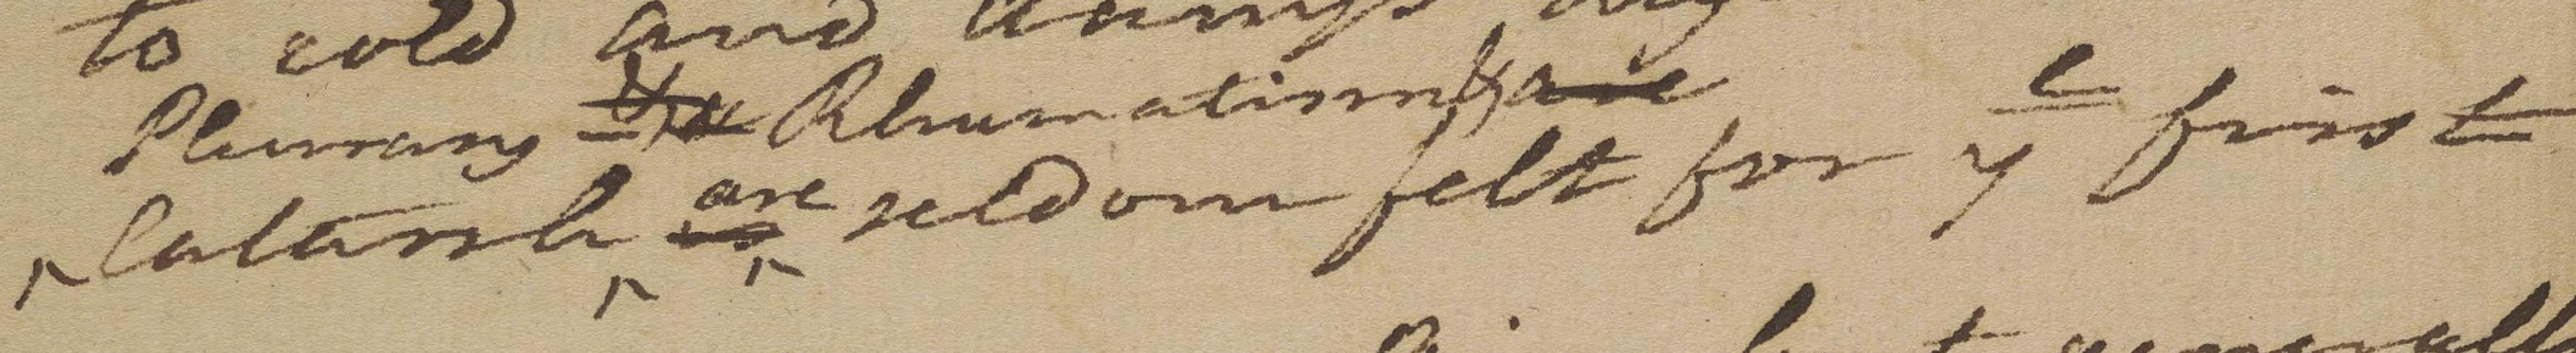^ Catarrh are seldom felt for y^e first
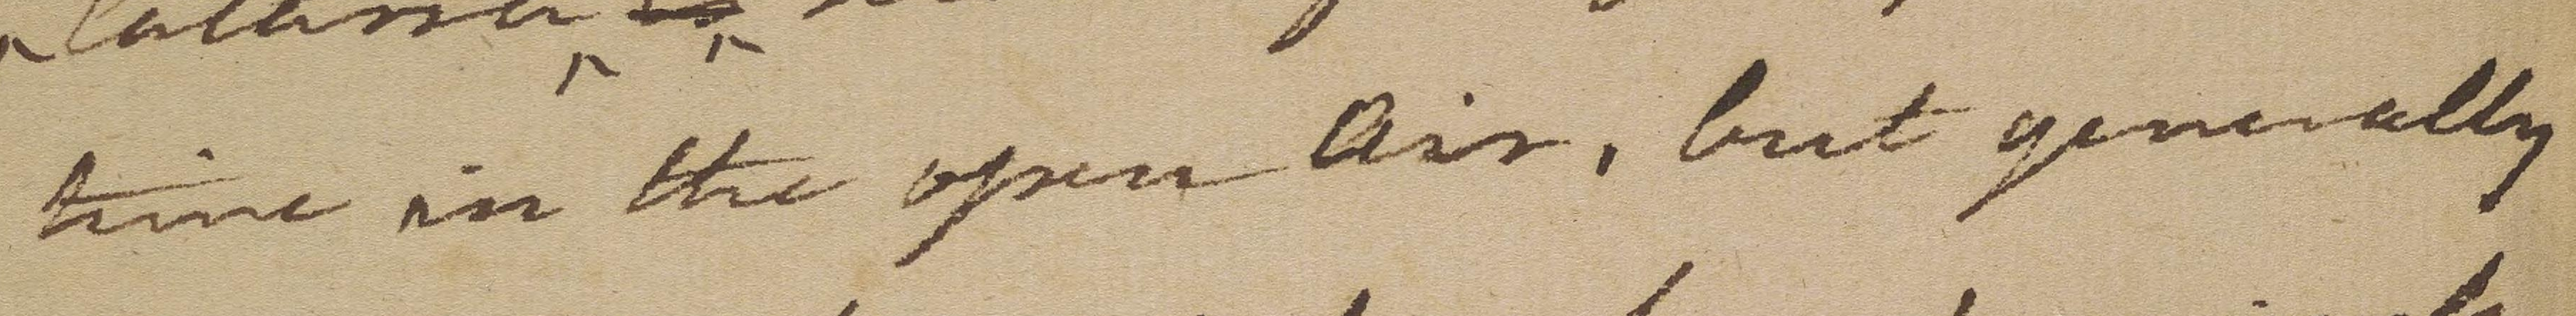time in the open air, but generally
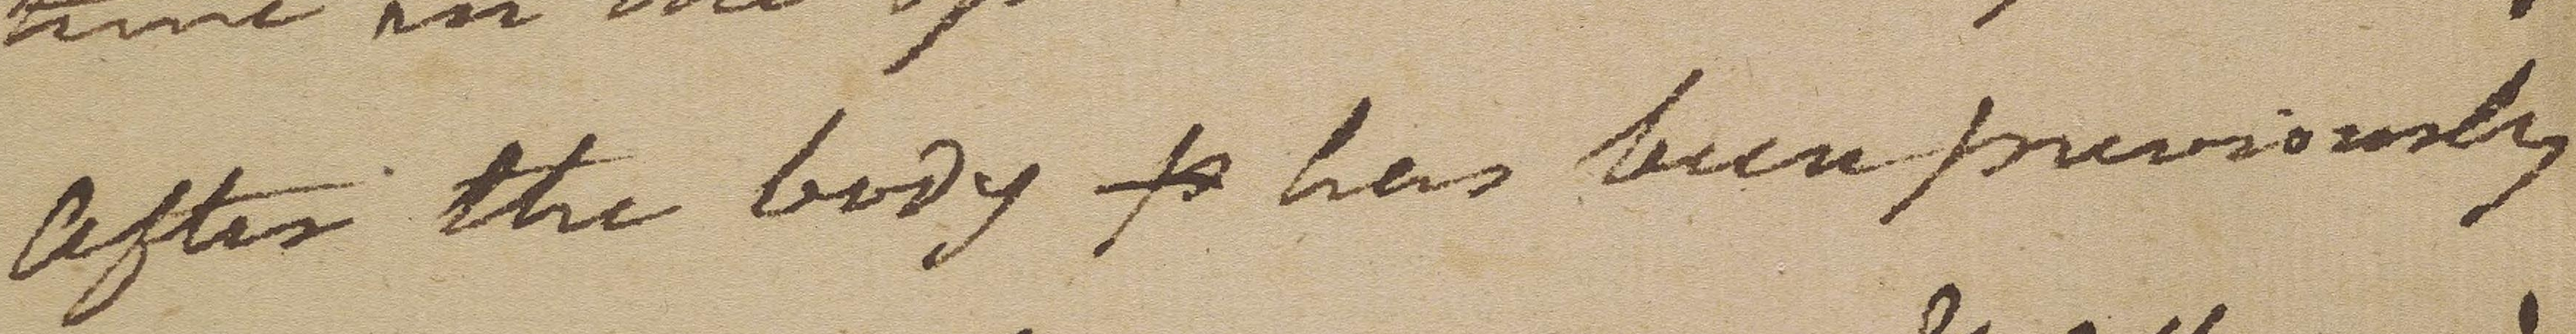after the body as has been previously
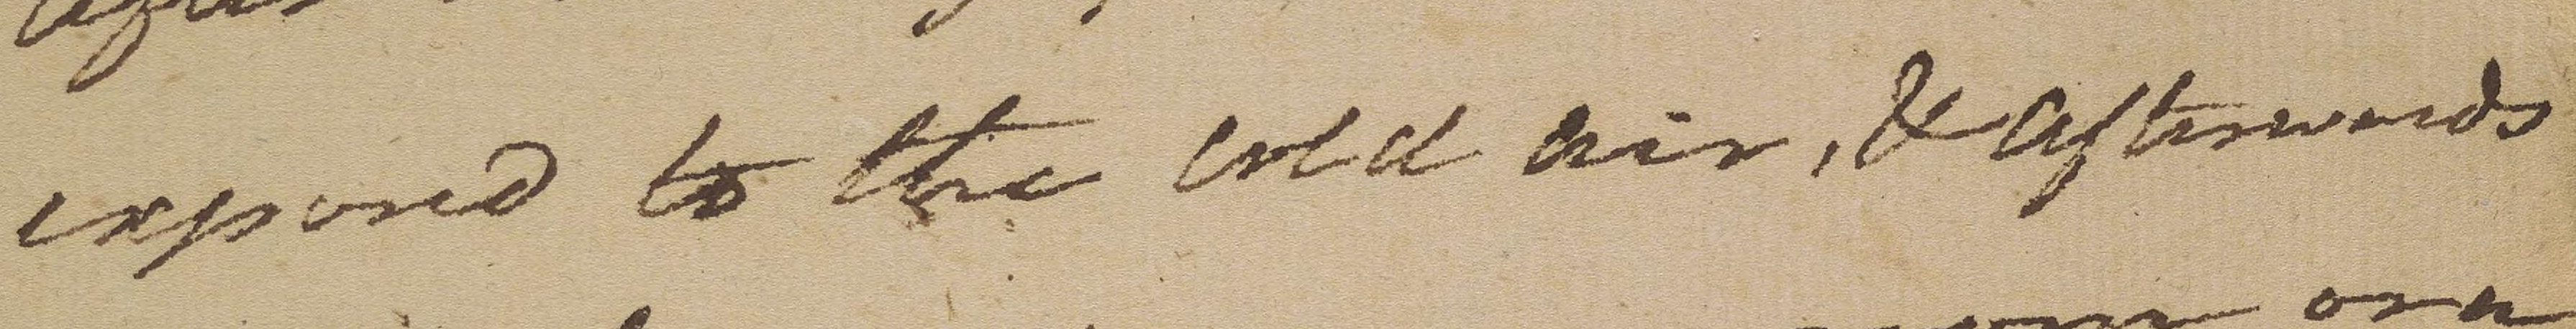exposed to the cold air, & afterwards
